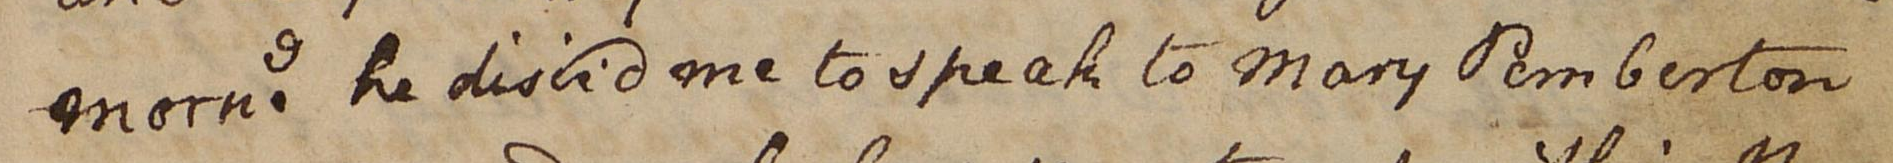morn^g. he disir'd me to speak to Mary Pemberton
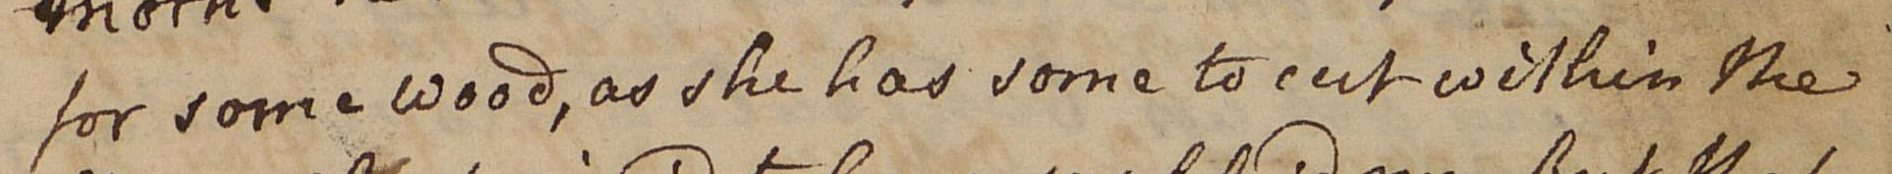for some wood, as she has some to cut within the
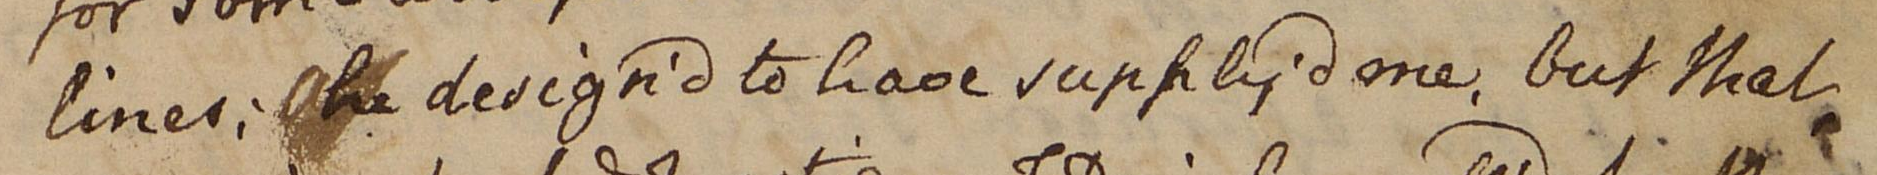lines; he design'd to have supply'd me, but that
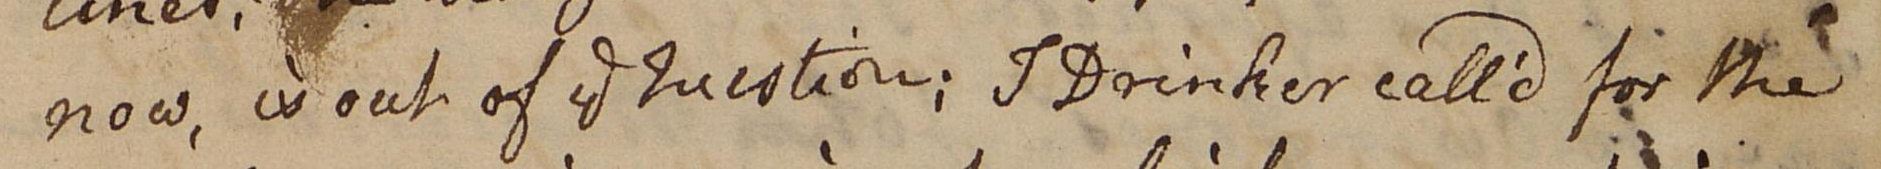now, is out of y^e Question; S Drinker call'd for the
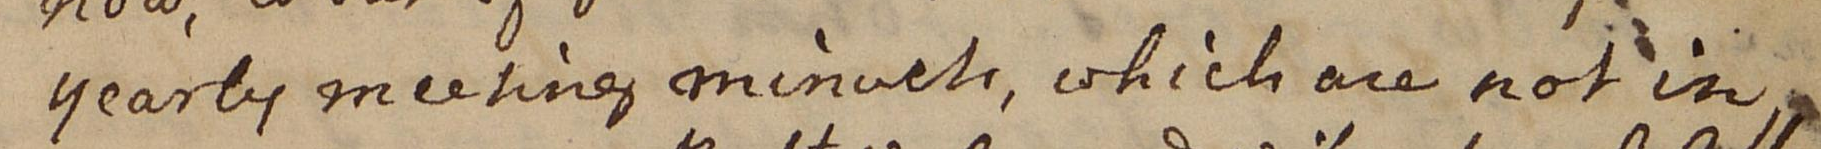yearly meeting minuets, which are not in
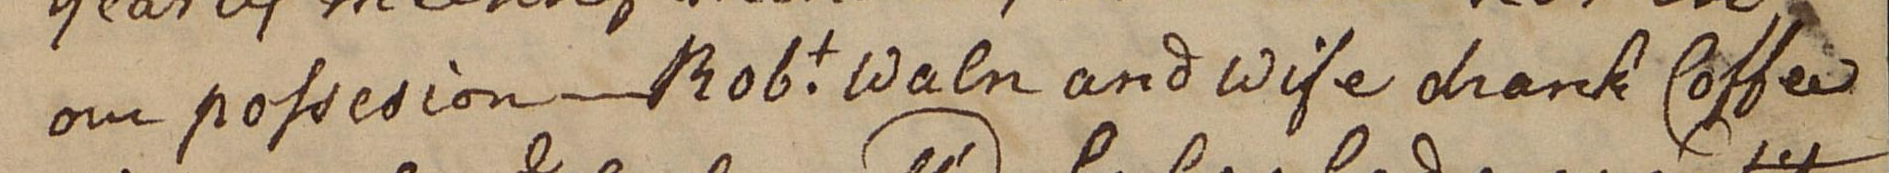our possesion- Rob^t. Waln and Wife drank Coffee
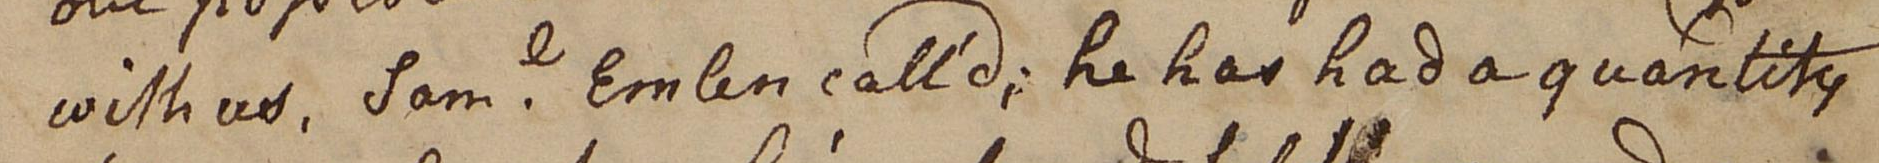with us, Sam^l. Emlen call'd; he has had a quantity
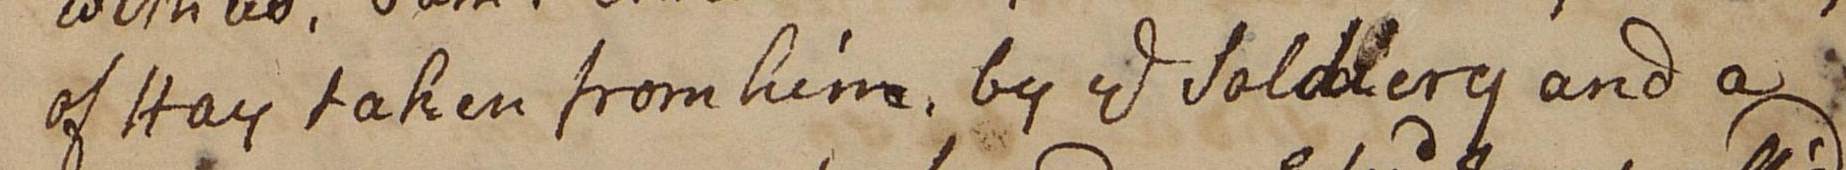of Hay taken from him, by y^e Soldiery and a
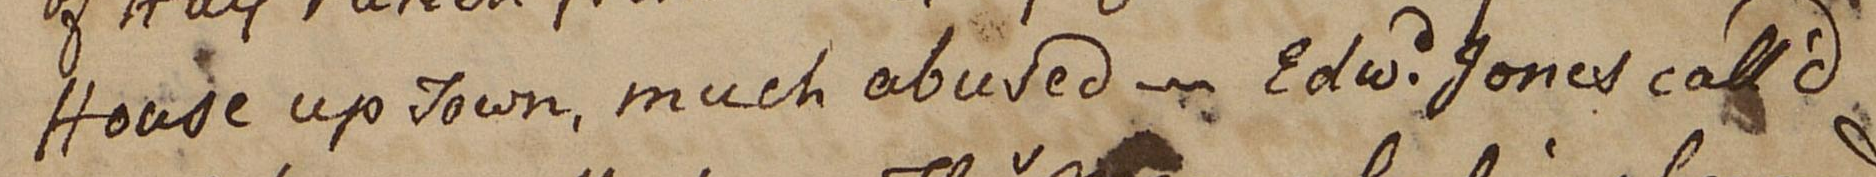House up Town, much abused- Edw^d. Jones call'd
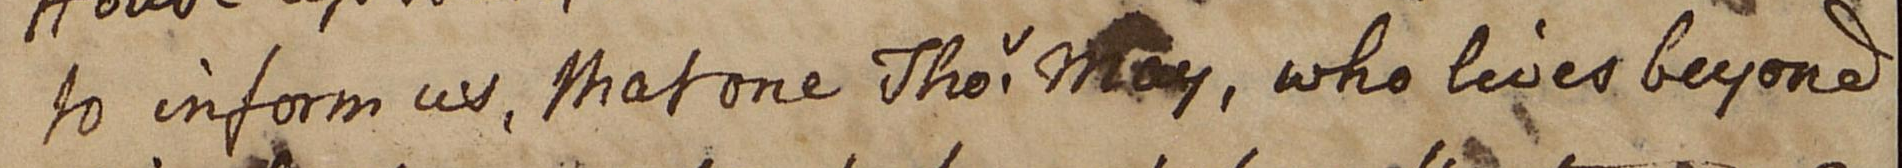to inform us, that one Tho^s. May, who lives beyond
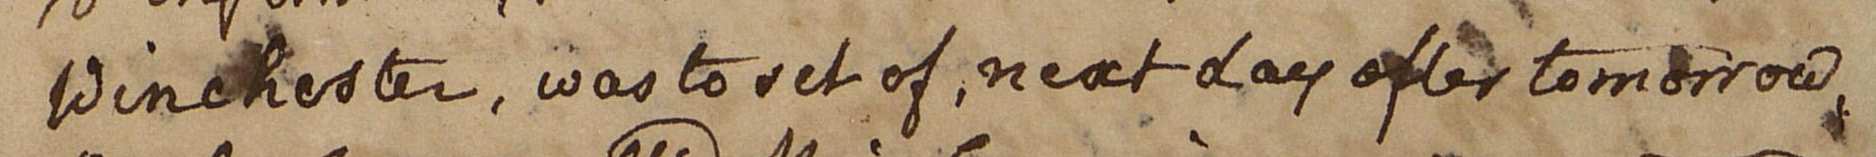Winchester, was to set of, next day after tomorrow,
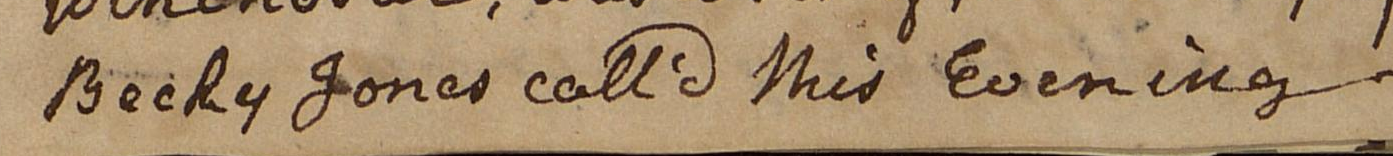Becky Jones call'd this Evening
